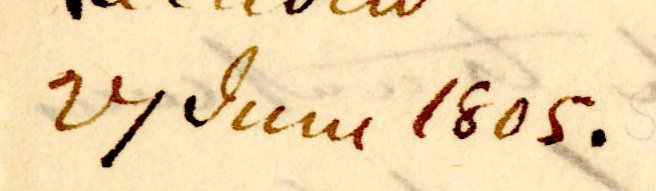27 July 1805.
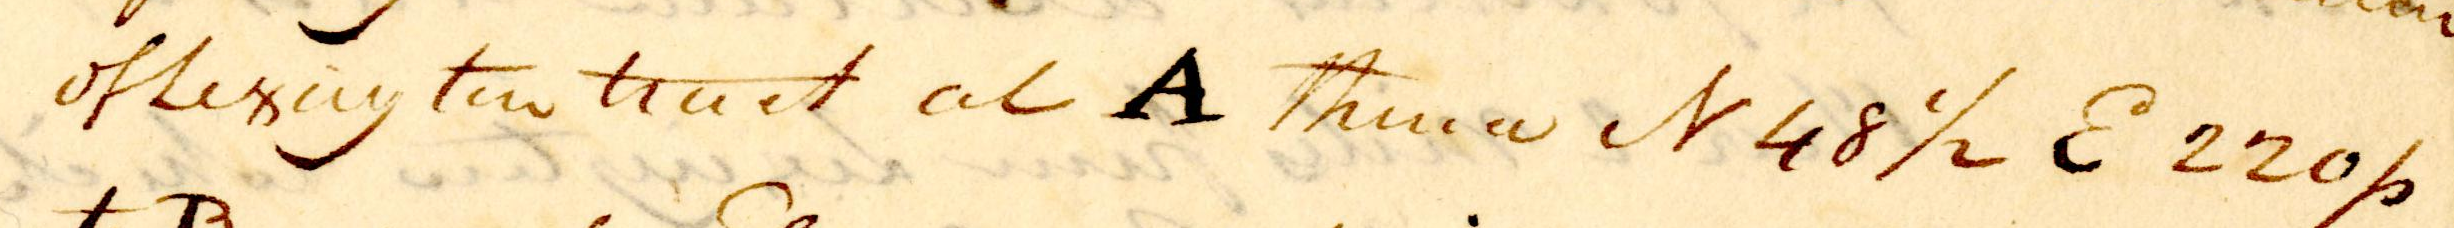of Lexington tract at A thence N 48 1/2 E 220p
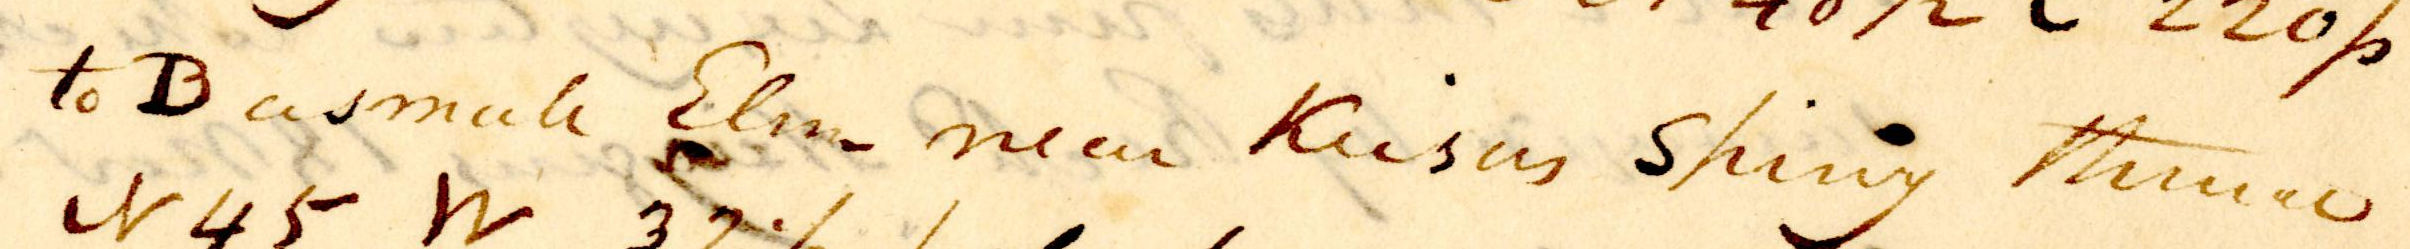to B a small Elm near Keisas Spiny thence
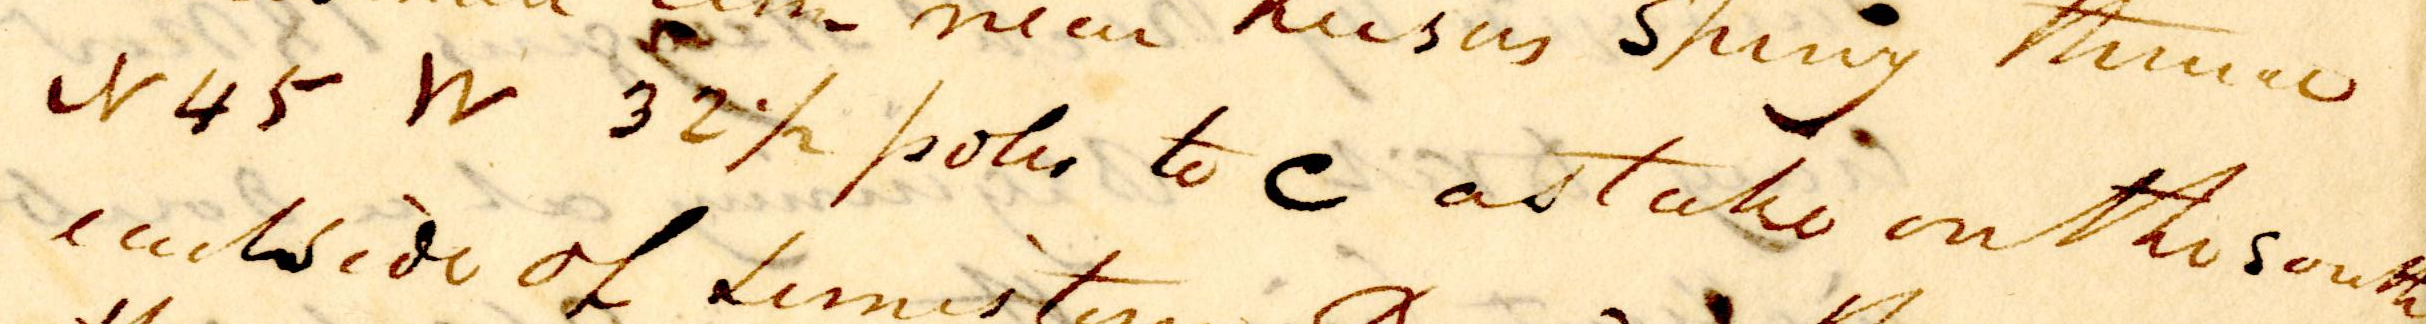N 45 W 32 1/2 poles to C a stake on the south
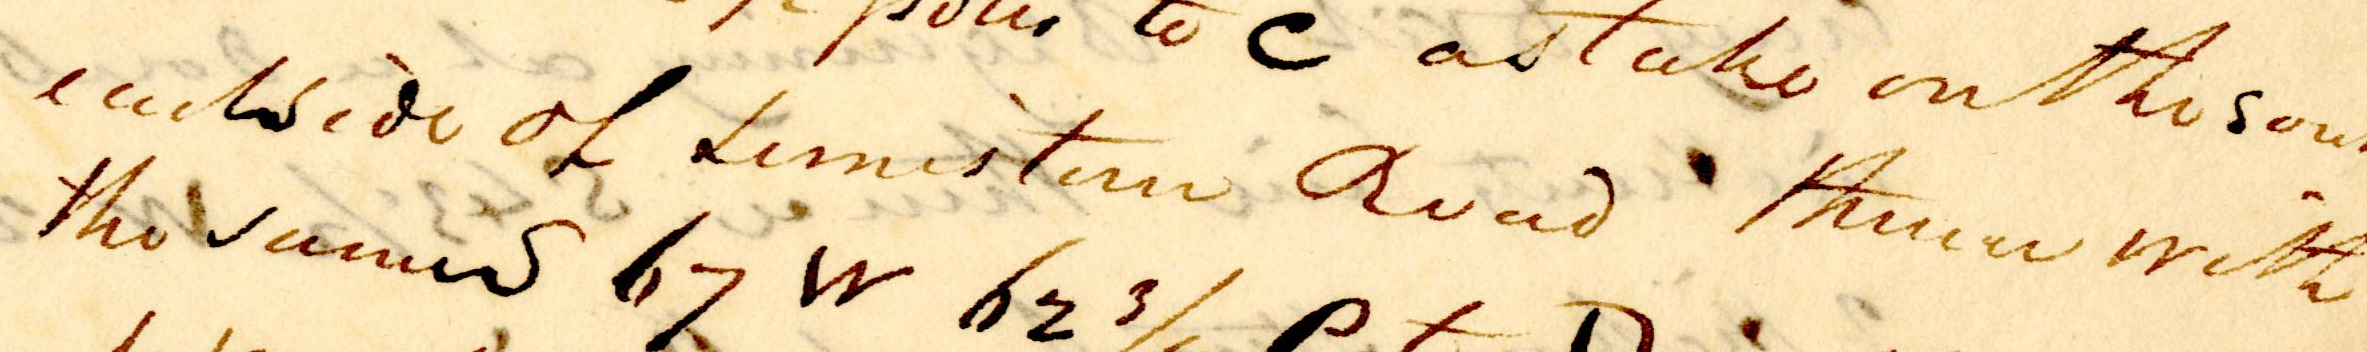eastside of Lemister Road thence with
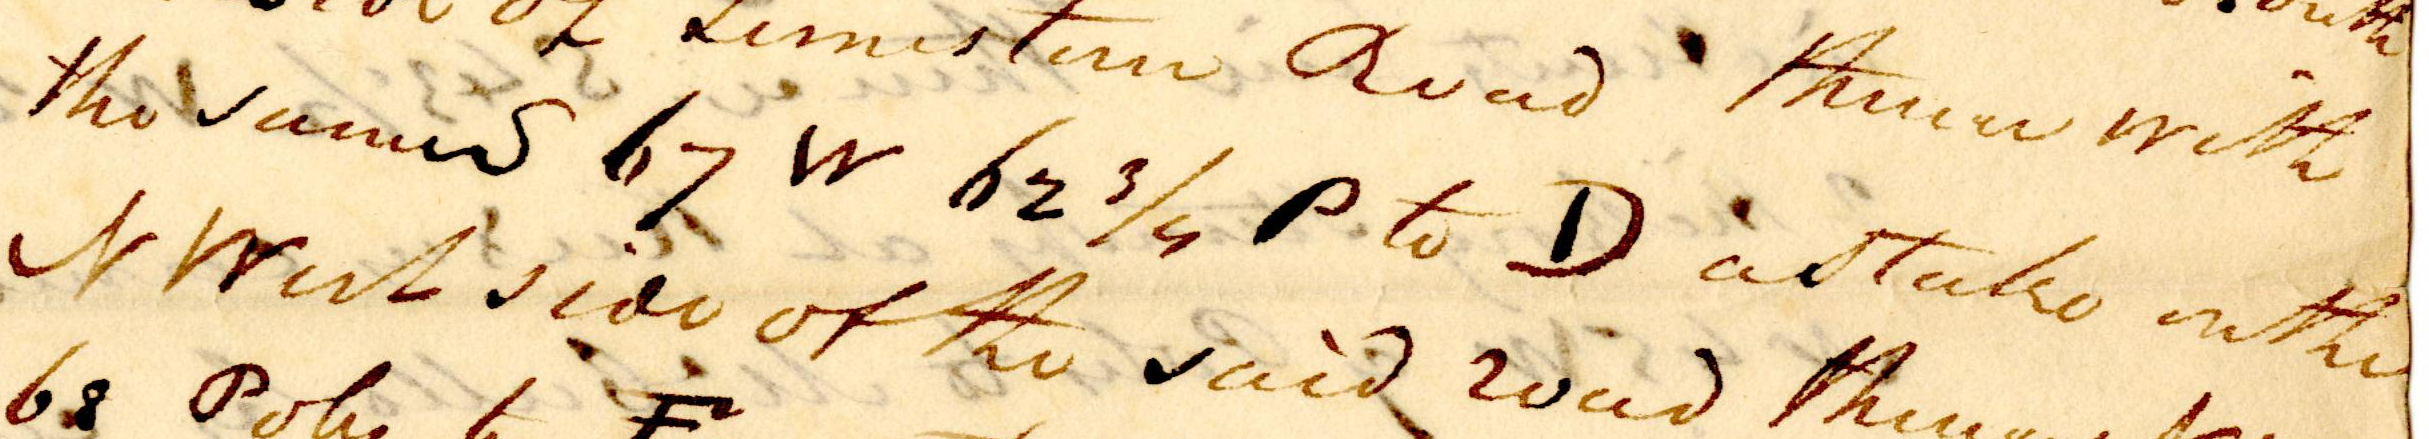the s acres 67 W 62 3/4 P to D a stake on the
